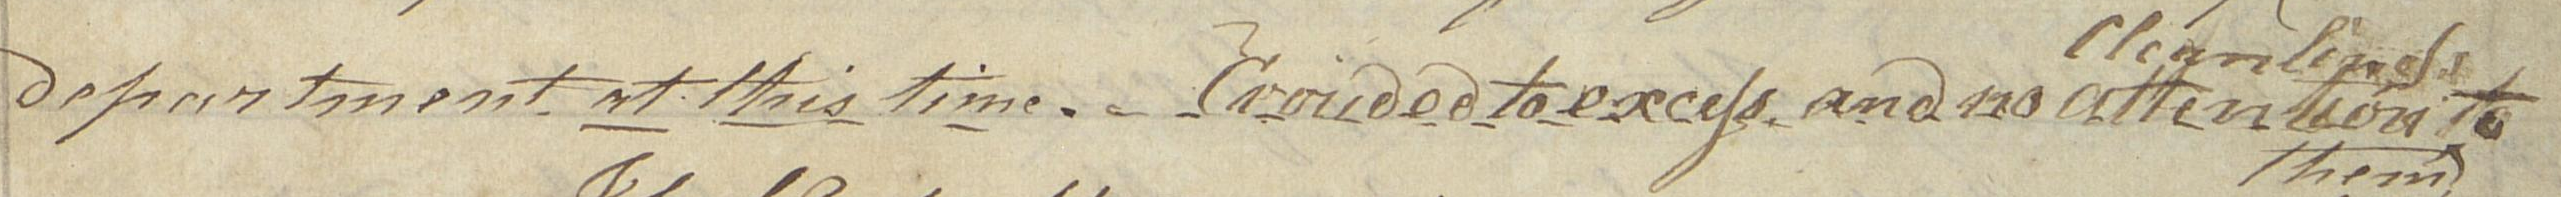department at this time. (avoided to excess. and no attention to
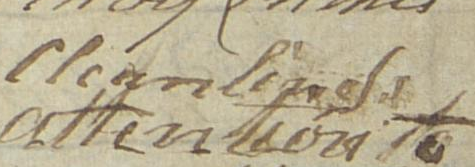cleanliness
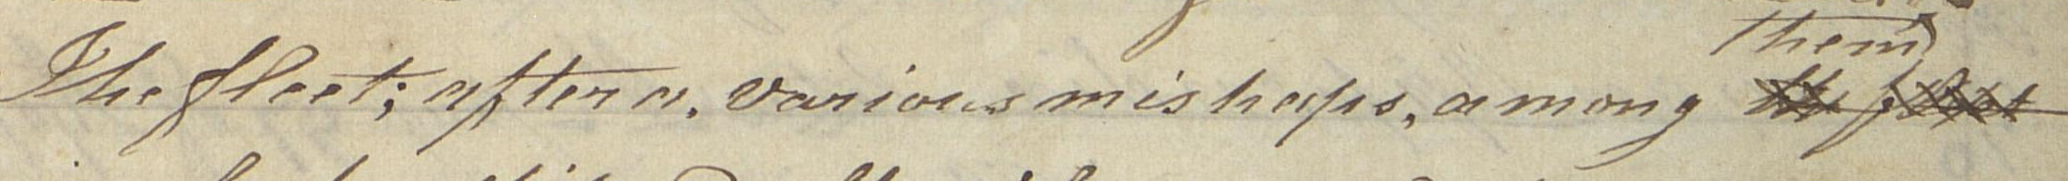The fleet; after a various mishaps, among the fleet
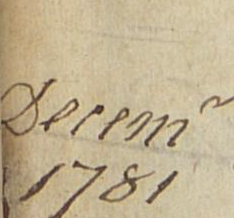Decem^r
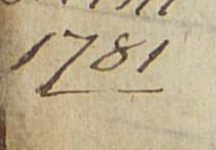1781
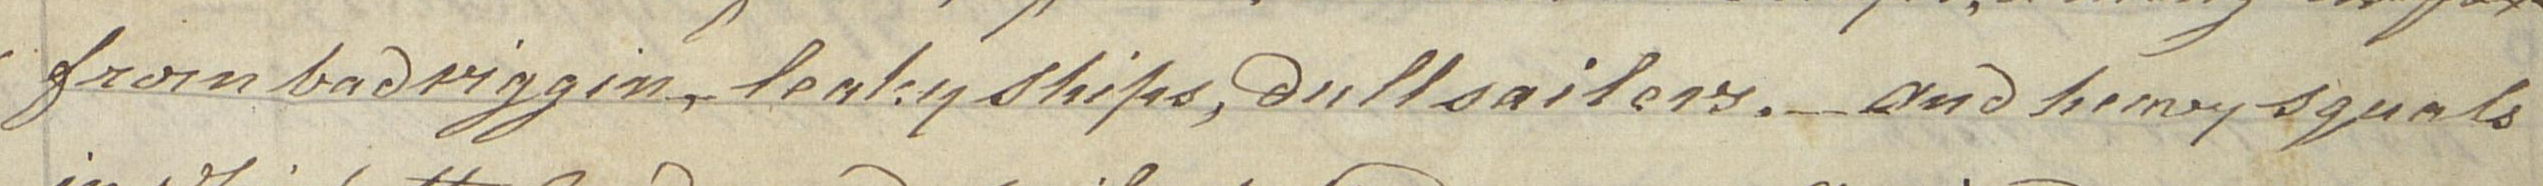from bad riggin, leaky ships, dull sailers. And heavy squals
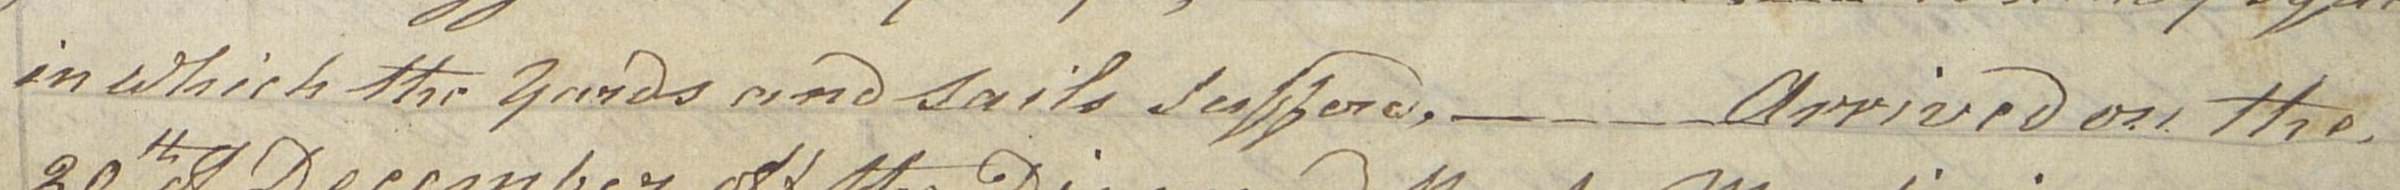in which the Yards and sails sufferd. Arrived on the
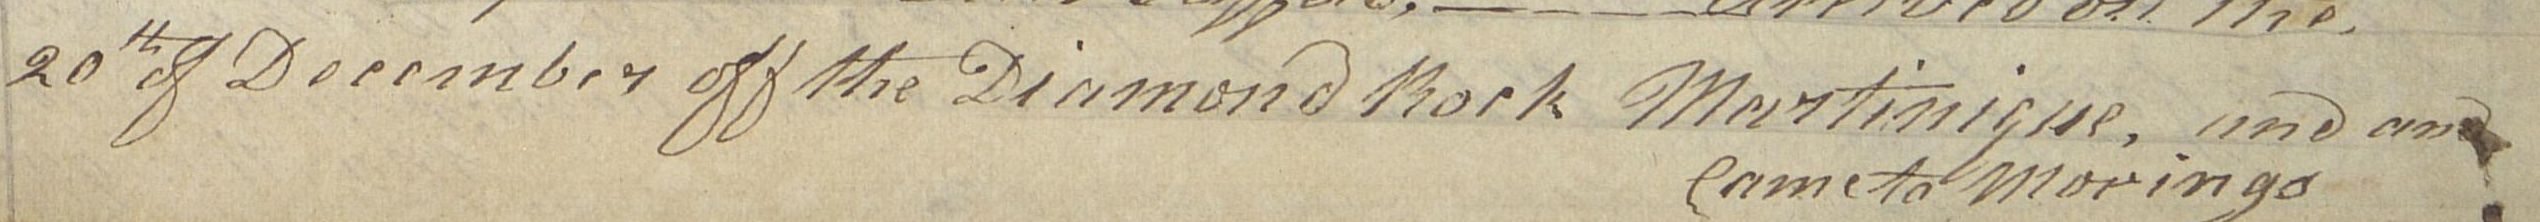20^th of December off the Diamond Rork Martinique, and and
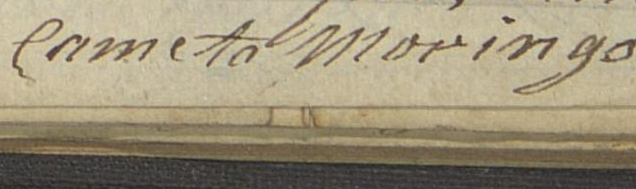Came to Morings
